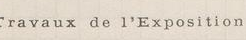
Travaux de l'Exposition
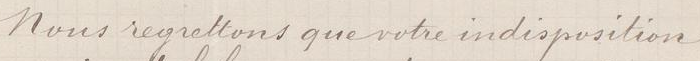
Nous regrettons que votre indisposition
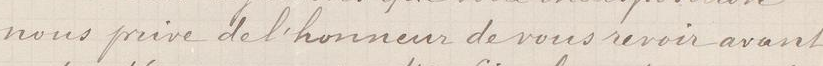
nous prive de l'honneur de vous revoir avant
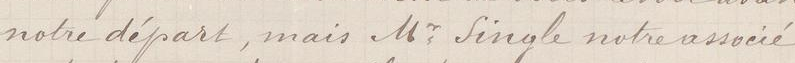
notre départ, mais MrSingle notre associé
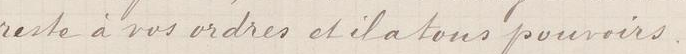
reste à vos ordres et il a tous pouvoirs.
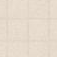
Cie
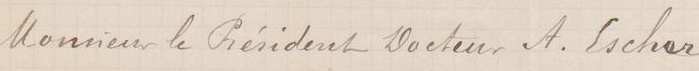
Monsieur le Président Docteur A. Escher.
